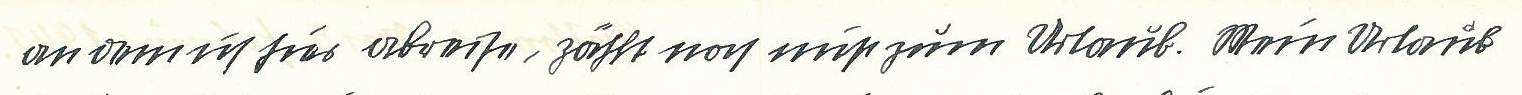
an dem ich hier abreise, zählt noch nicht zum Urlaub. Mein Urlaub
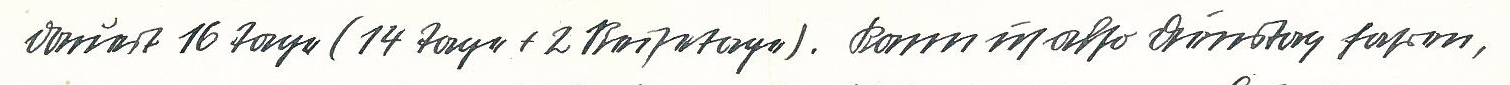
dauert 16 Tage (14 Tage + 2 Reisetage). Kann ich also Dienstag fahren,
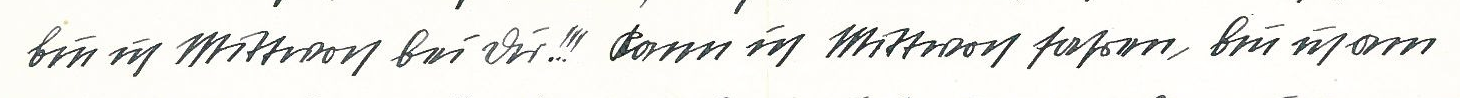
bin ich Mittwoch bei Dir!!! Kann ich Mittwoch fahren, bin ich am
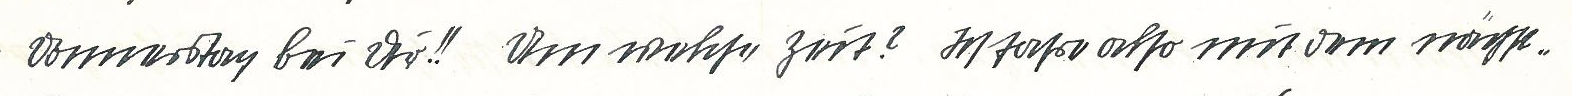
Donnerstag bei Dir!! Um welche Zeit? Ich fahre also mit dem nächst¬
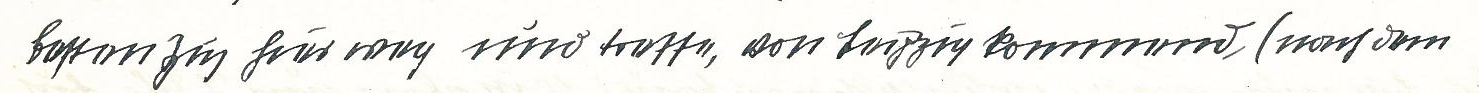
besten Zug hier weg und hoffe, von Leipzig kommend, (nach dem
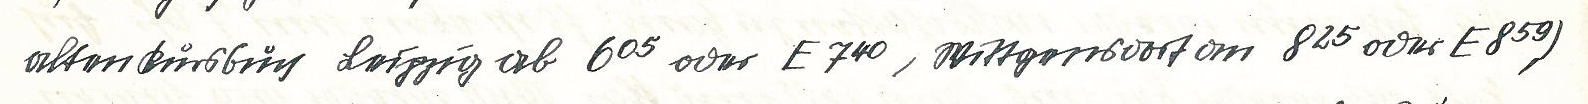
alten Kursbuch Leipzig ab oder E, W. an oder E,)
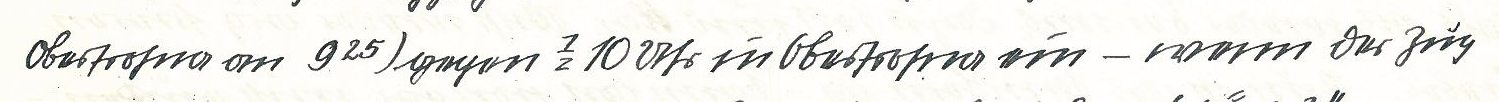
O. an) gegen Uhr O. ein – wenn der Zug
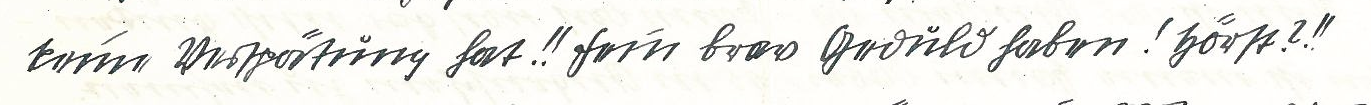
keine Verspätung hat!! Fein brav Geduld haben! Hörst?!!
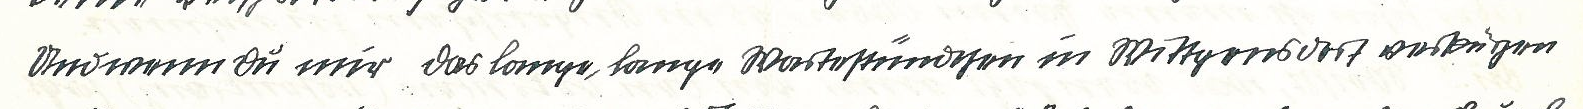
Und wenn Du mir das lange, lange Wartestündchen in W. verkürzen
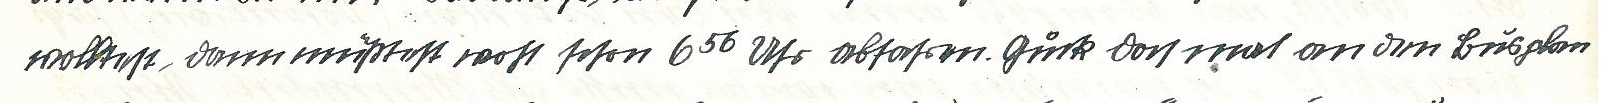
wolltest, dann müßtest wohl schon Uhr abfahren. Guck doch mal an den Busplan
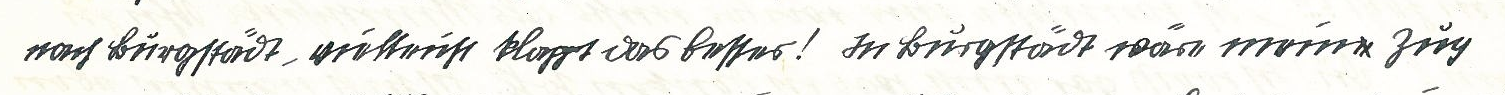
nach B., vielleicht klappt das besser! In B. wäre meine Zug
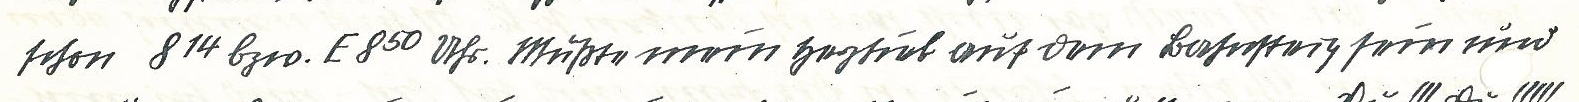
schon bzw. E Uhr. Müßte mein Herzlieb auf dem Bahnsteig sein und
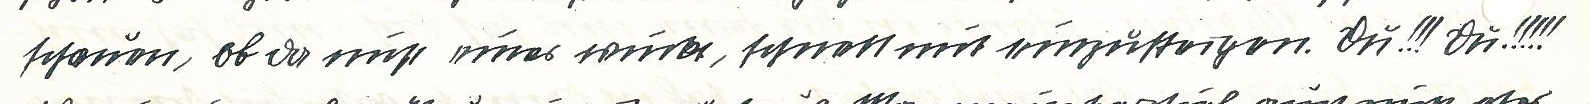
schauen, ob da nicht einer winkt, schnell mit einsteigen. Du!!! Du!!!!!
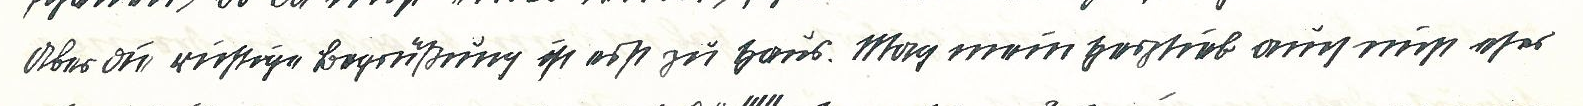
Aber die richtige Begrüßung ist erst zu Haus. Mag mein Herzlieb auch nicht eher
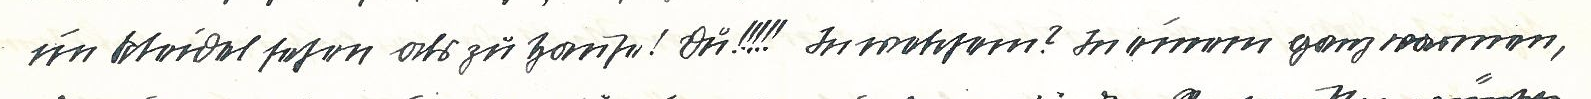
im Kleidel sehen als zu Hause! Du!!!!! In welchem? In einem ganz warmen,
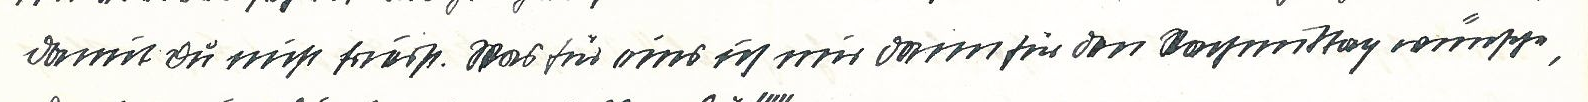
damit Du nicht frierst. Was für eins ich mir dann für den Nachmittag wünsche,
